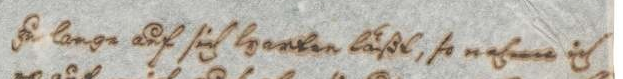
zu lange auf sich warten läßt, so nehme ich
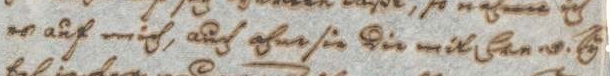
es auf mich, auch ohne sie die mit Hrn v. Sy-
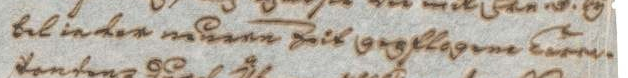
bel in der neuern Zeit gepflogene Corre-
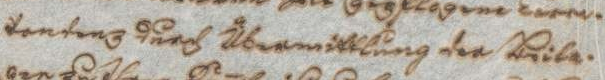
spondenz durch Übermittlung der Beila-
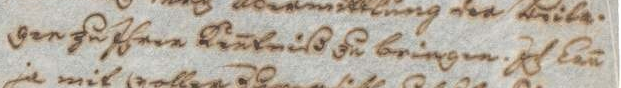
gen zu Ihrer Kenntniß zu bringen. Ich kann
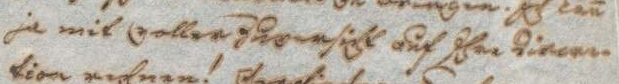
ja mit voller Zuversicht auf Ihre Discre-
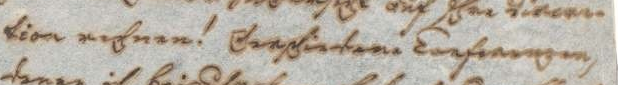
tion rechnen! Verschiedene Conferenzen,
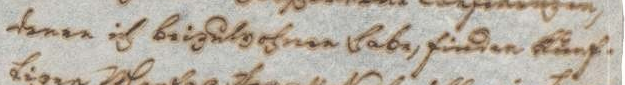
denen ich beizuwohnen habe, finden künf-
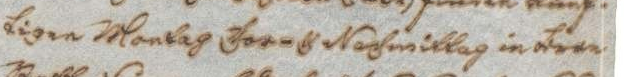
tigen Montag Vor- & Nachmittag in Bern
